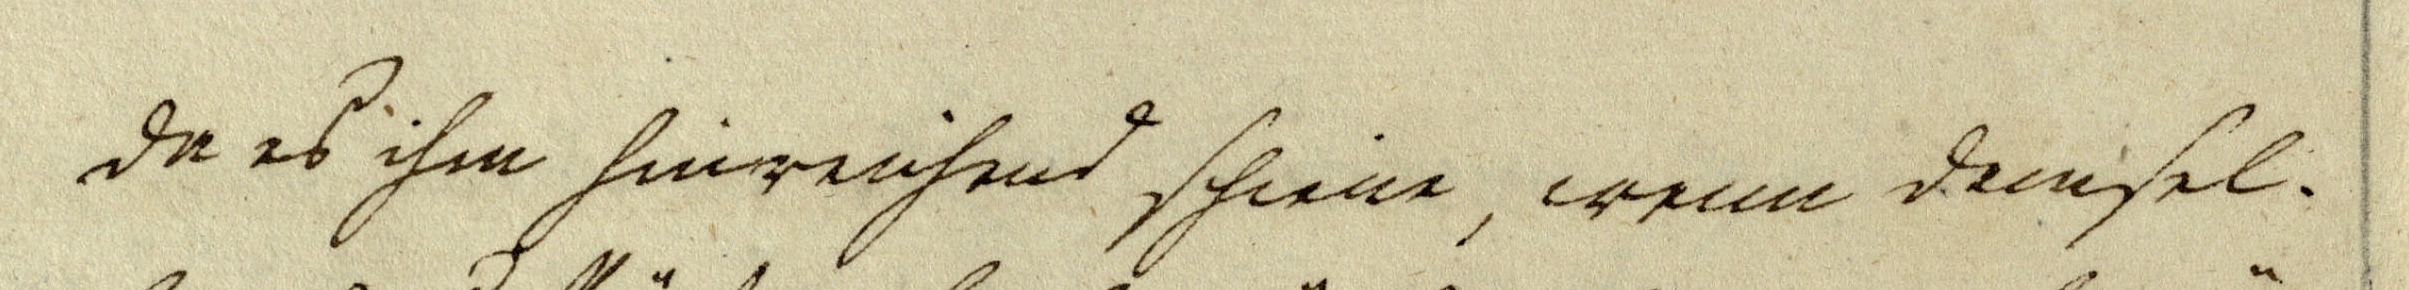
da es ihm hinreichend schiene, wenn demsel¬
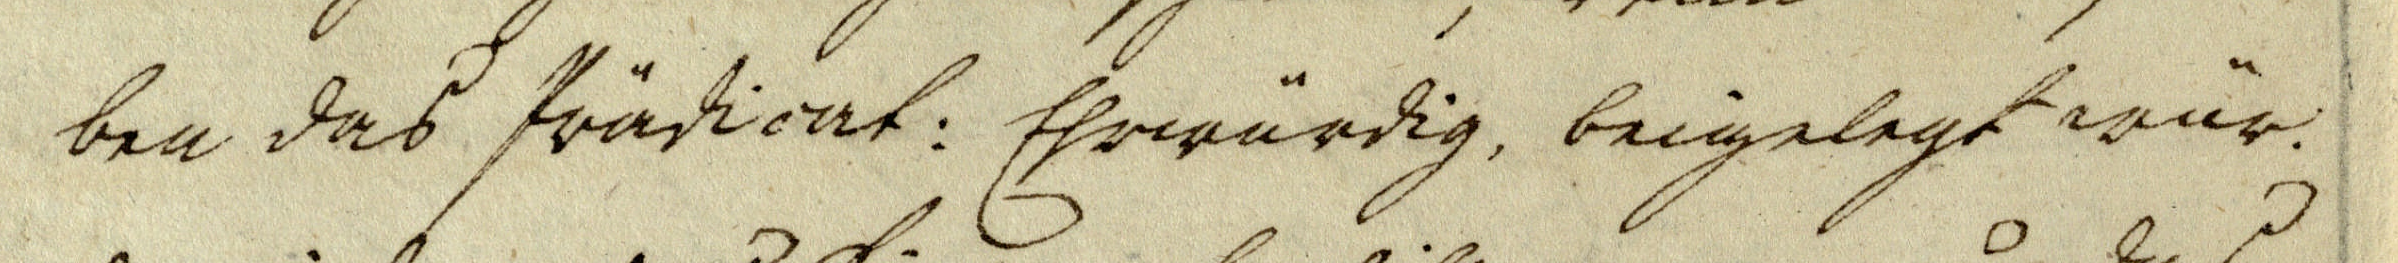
ben das Prädicat: Ehrwürdig, beigelegt wür¬
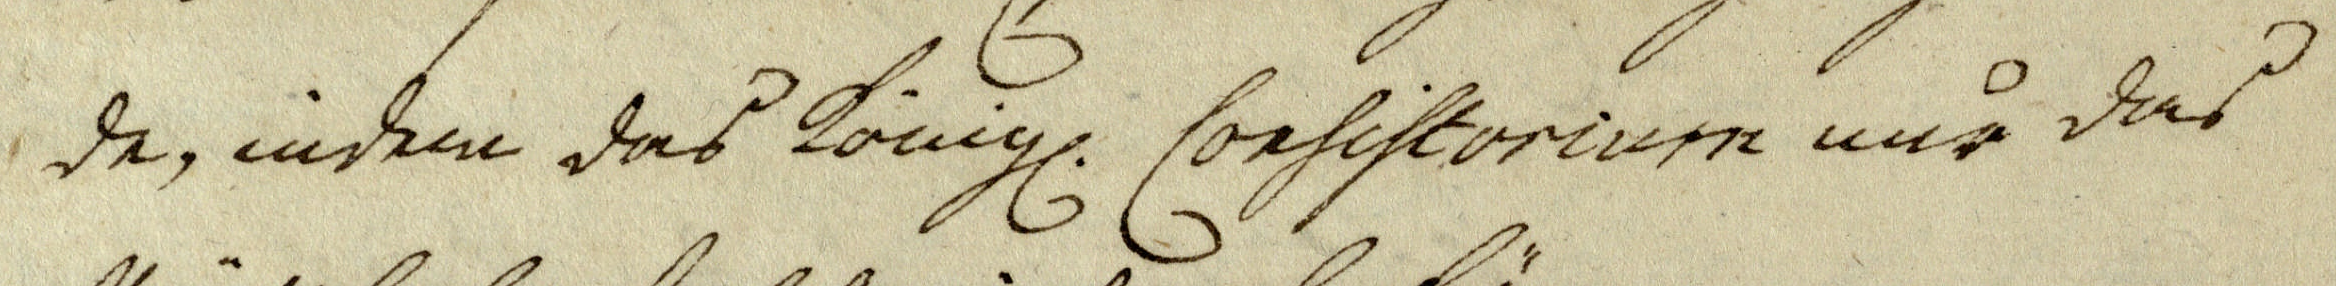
de, indem das Königl. Consistorium nur das
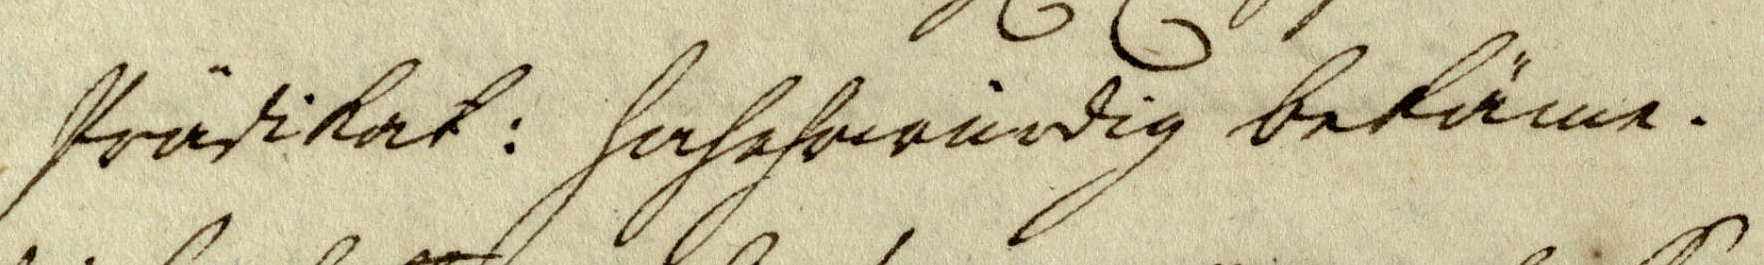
Prädikat: Hochehrwürdig bekäme.
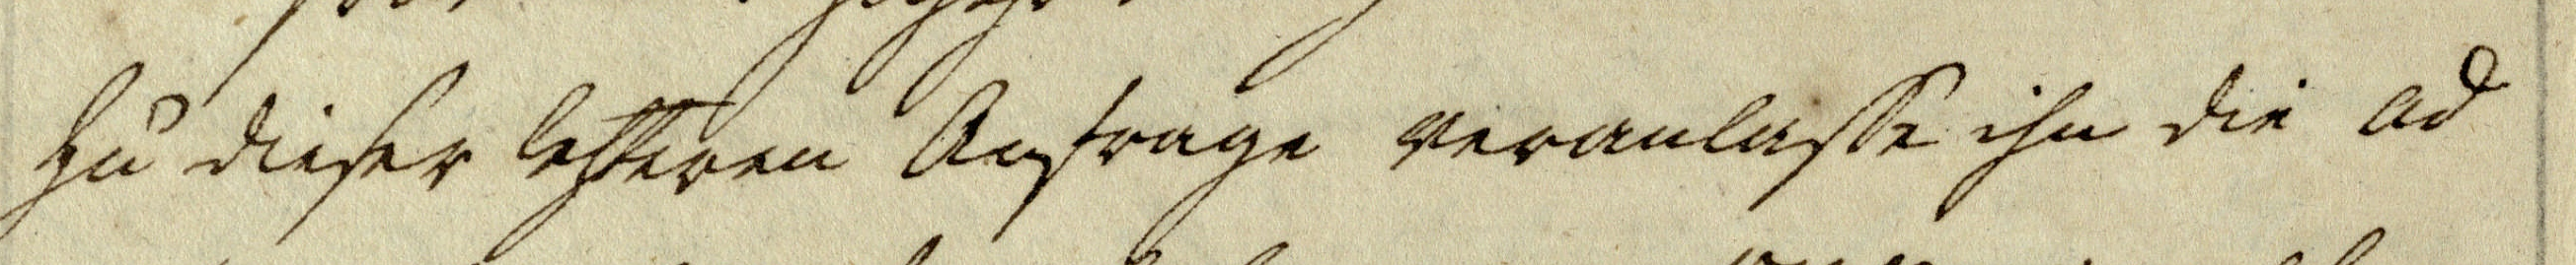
Zu dieser letzteren Anfrage veranlasse ihn die ad
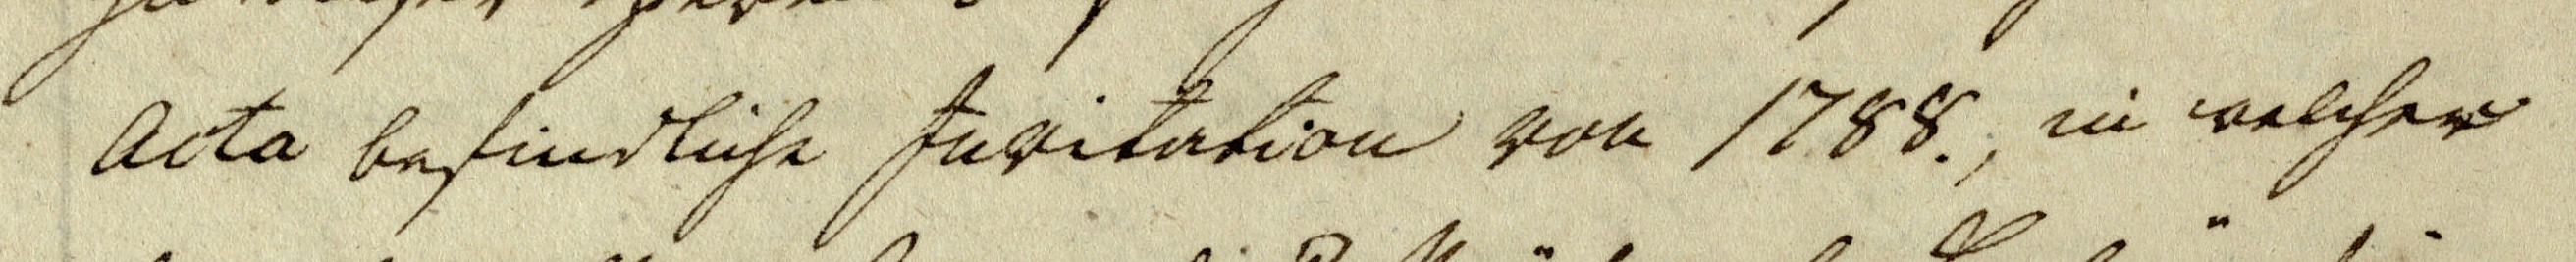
Acta befindliche Invitation von 1788., in welcher
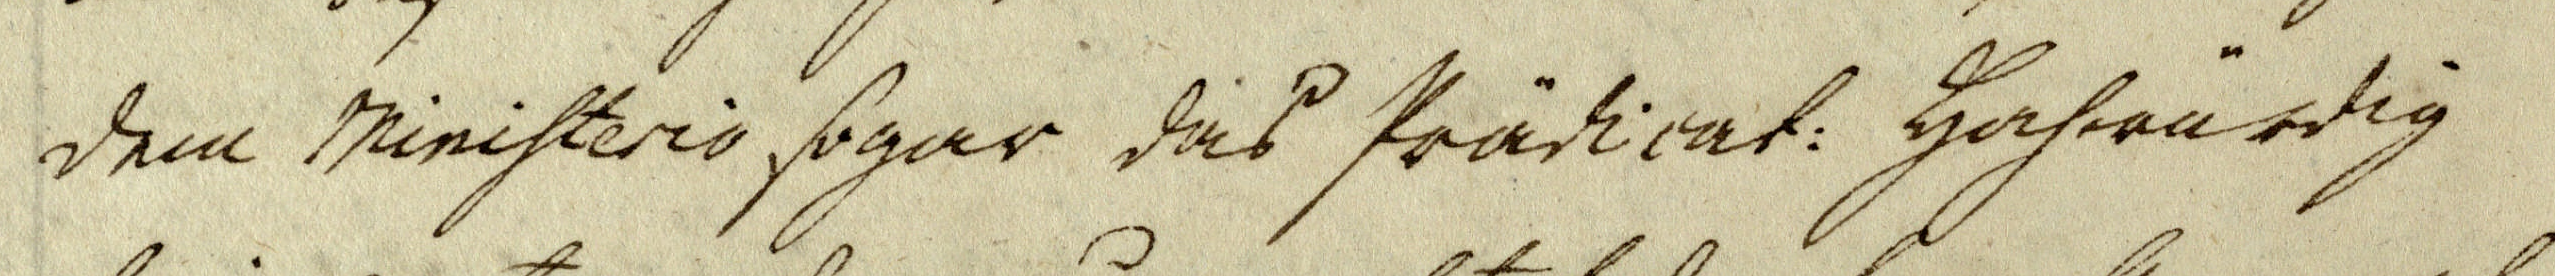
dem Ministerio sogar das Prädicat: Hochwürdig
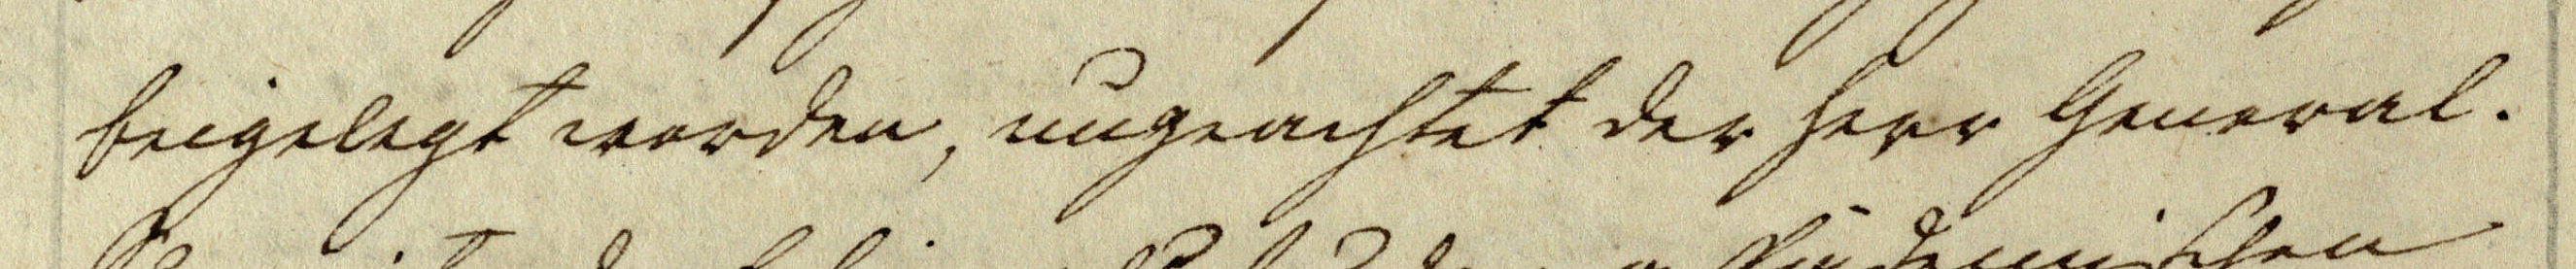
beigelegt worden, ungeachtet der Herr General¬
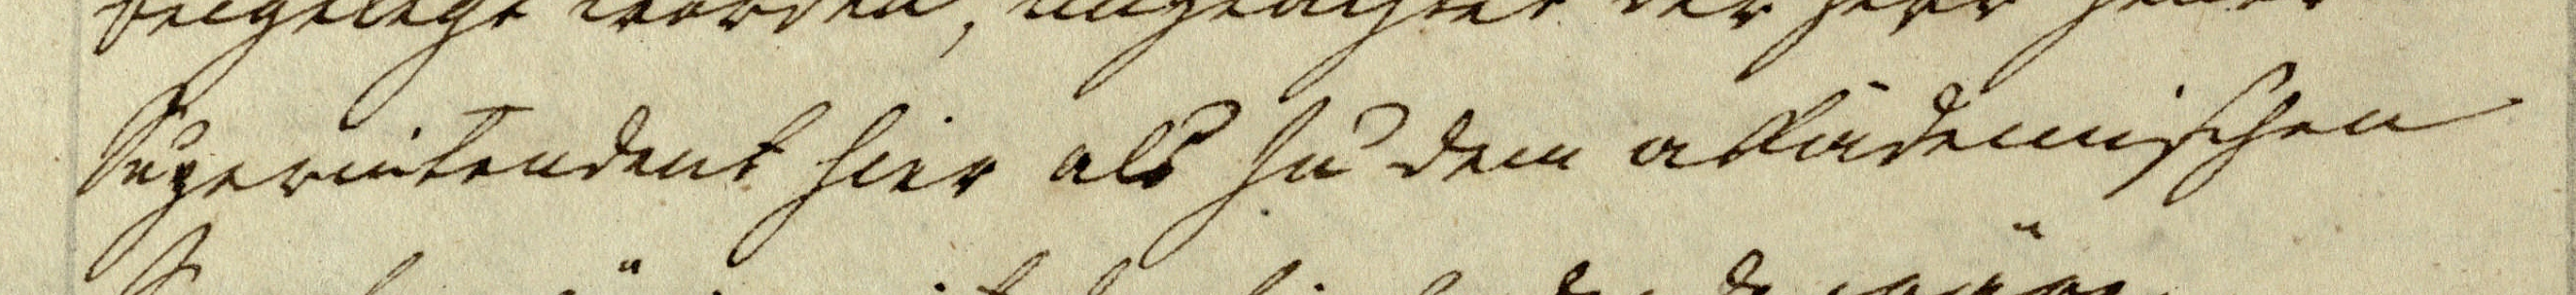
Superintendent hier als zu dem akademischen
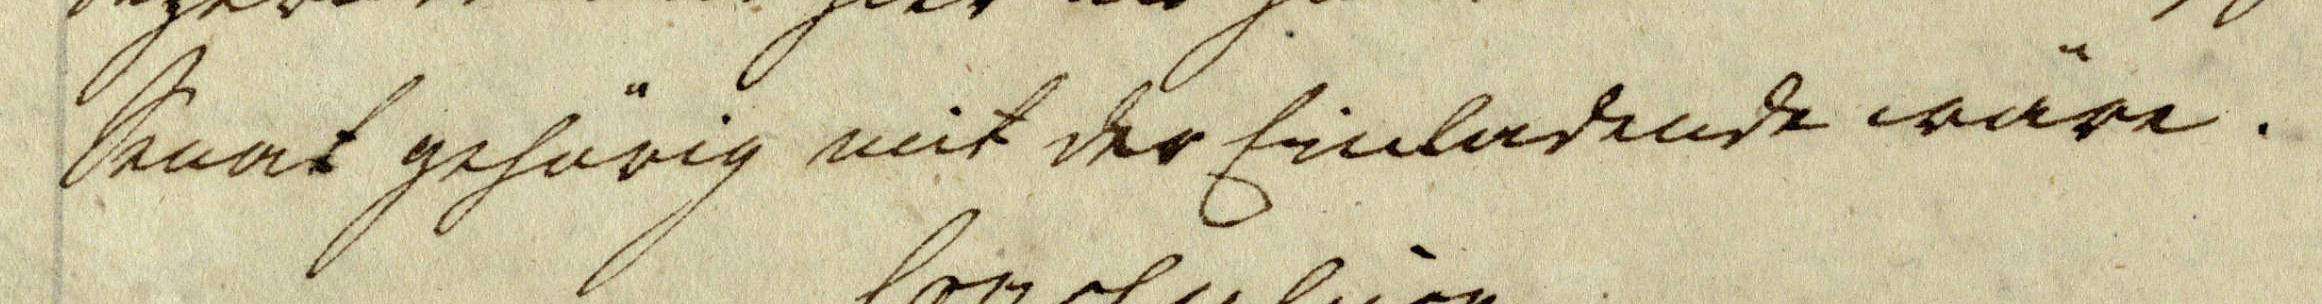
Senat gehörig mit der Einladende wäre.
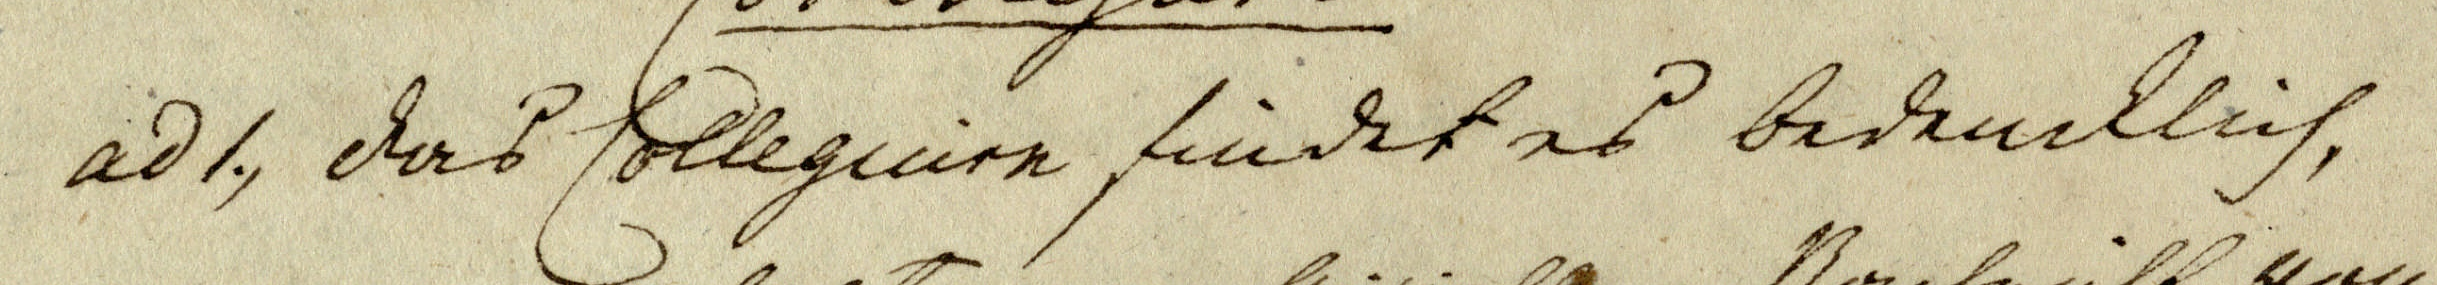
ad 1., Das Collegium findet es bedencklich,
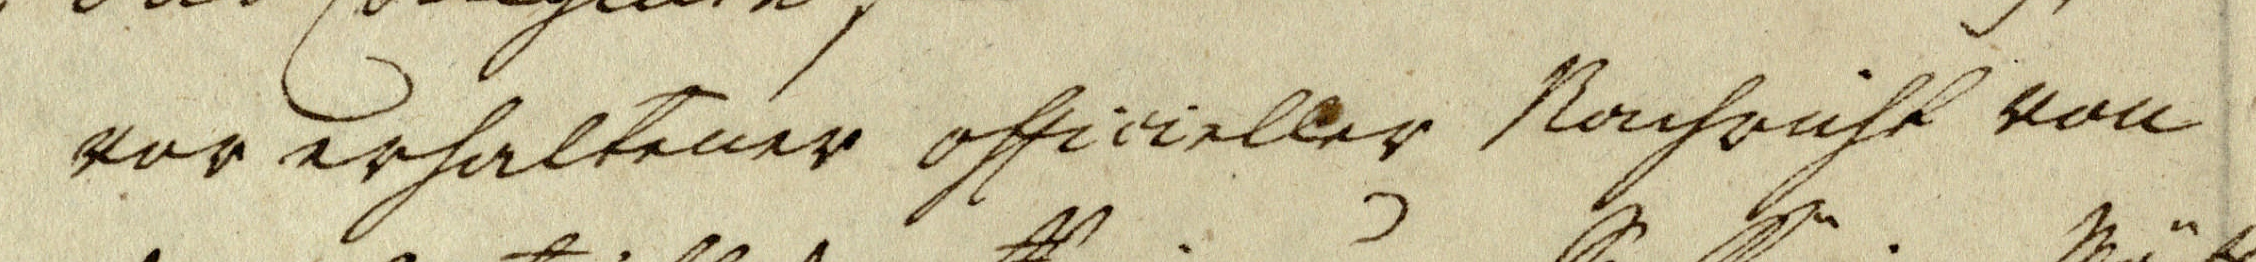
vor erhaltener officieller Nachricht von
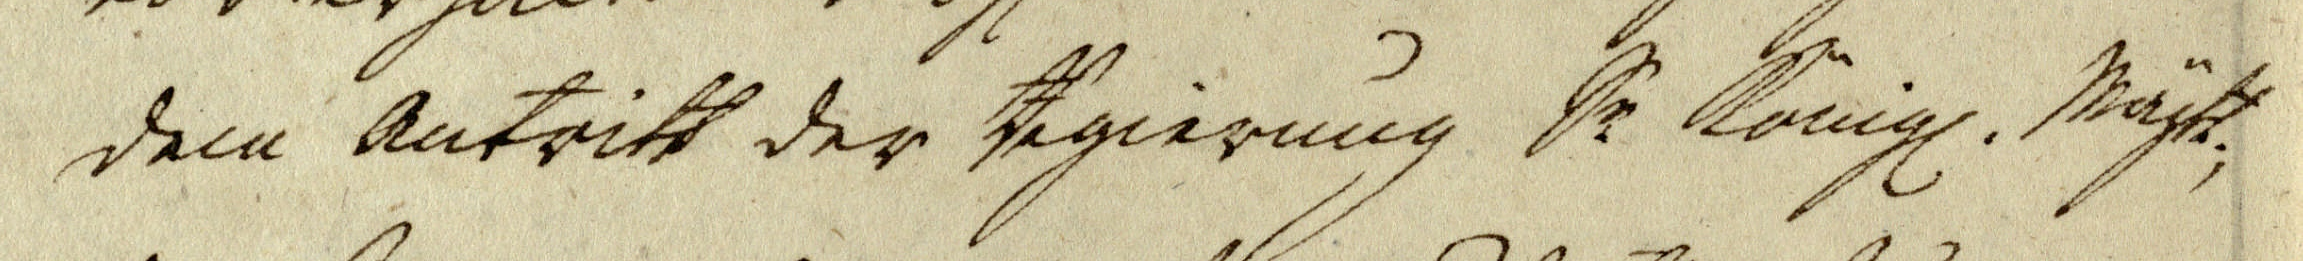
dem Antritt der Regierung Sr. Königl. Maÿtt.,
